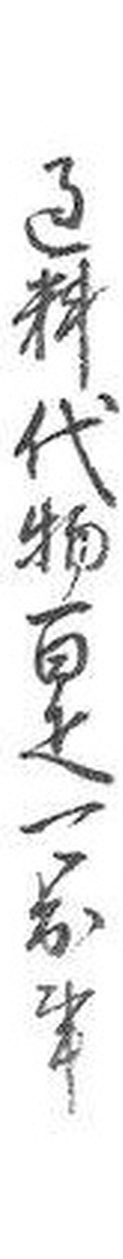過料代物百疋可出事
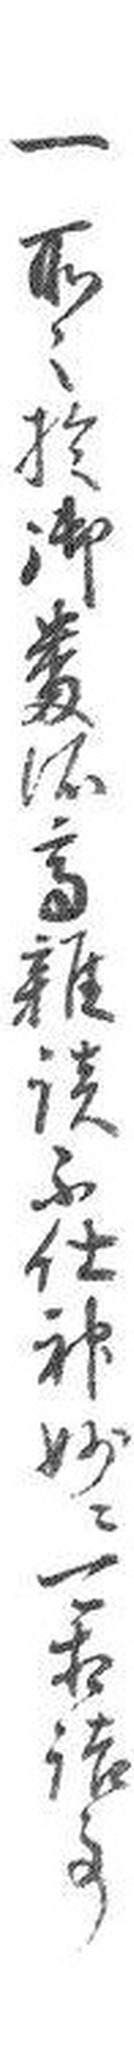一所々於御番所高雑談不仕神妙ニ可相詰事
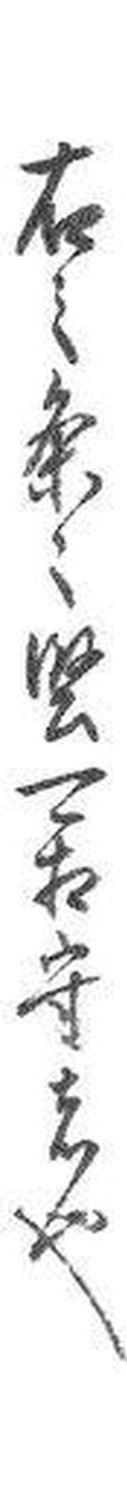右之条々堅可相守者也
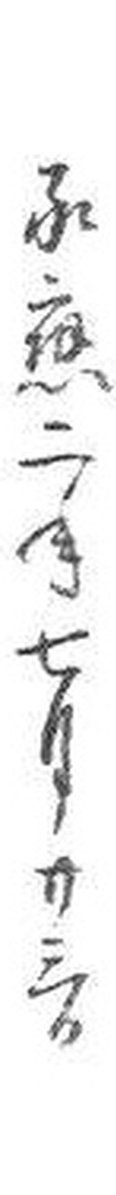承応二年七月廿三日
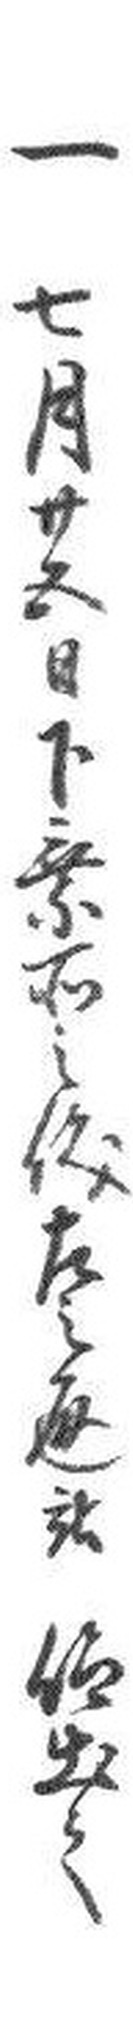一七月廿五日下乗所之儀左之通被仰出之
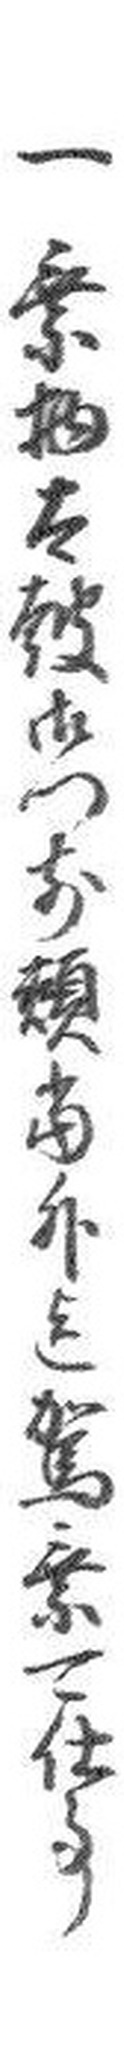一乗物太鼓御門前頬当外迄駕乗可仕事
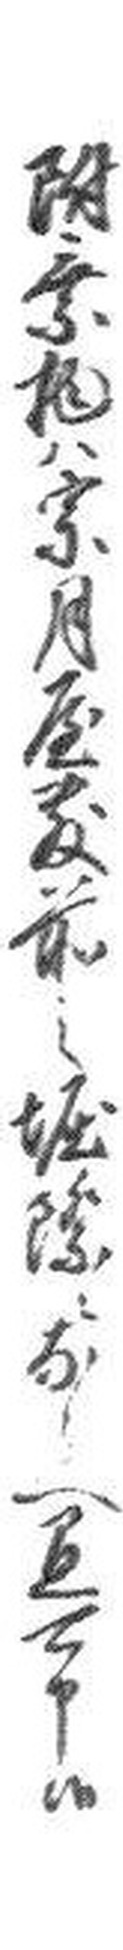附乗物ㇵ宗月屋敷前之堀際ニならへ置可申候
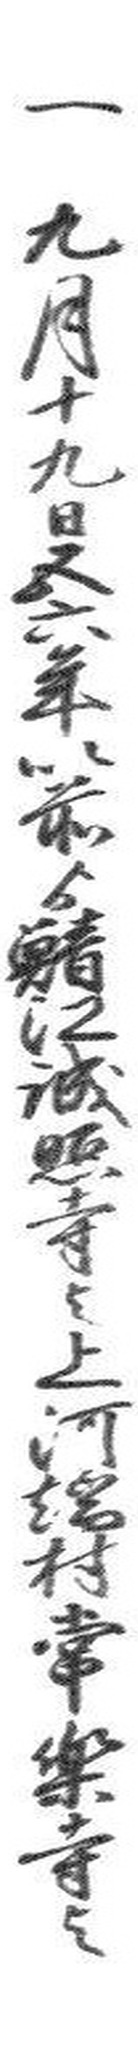一九月十九日五六年以前ゟ鯖江誠照寺与上河端村常楽寺与
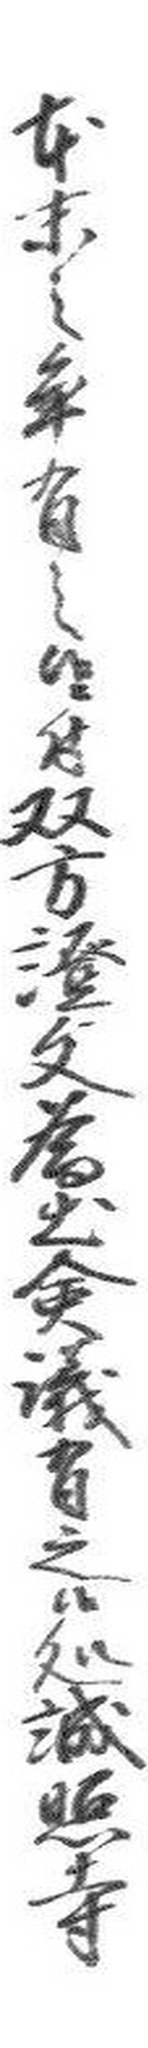本末之争有之候ニ付双方証文為出僉議有之候処誠照寺
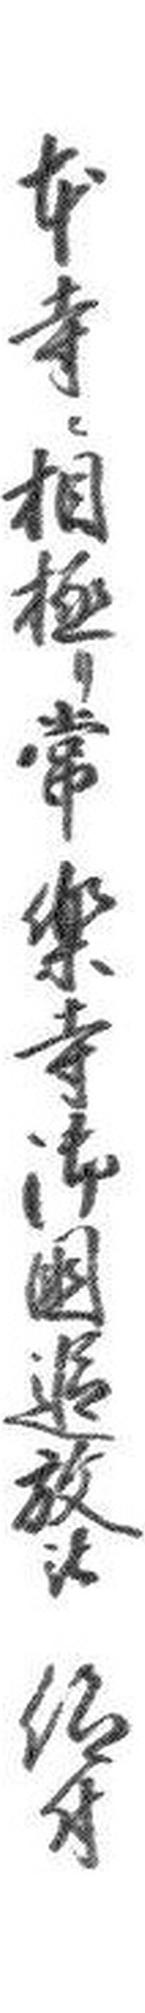本寺ニ相極リ常楽寺御国追放被仰付
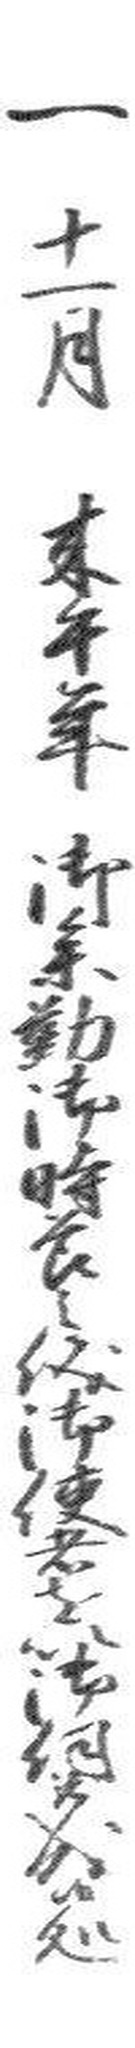一十一月来午年御参勤御時節之儀御使者を以御伺被成候処
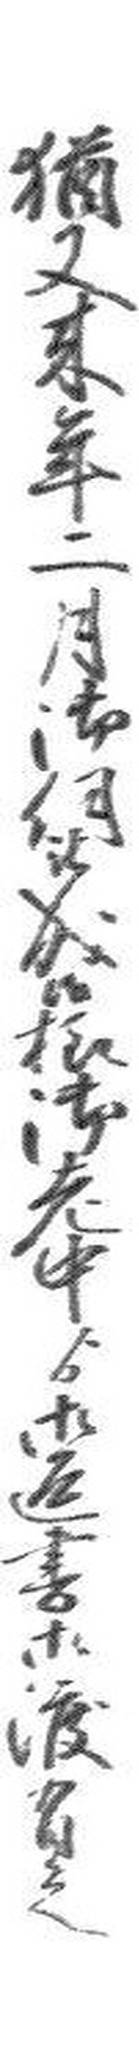猶又来年二月御伺被成候様御老中ゟ御返書御渡有之
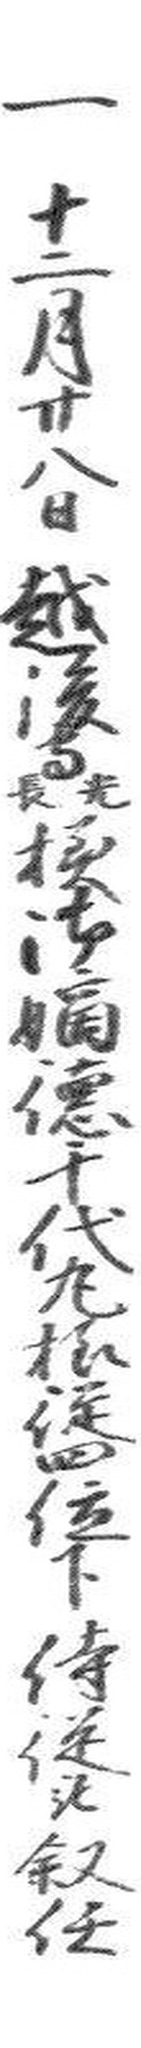一十二月廿八日越後守光長様御嫡徳千代丸様従四位下侍従被叙任
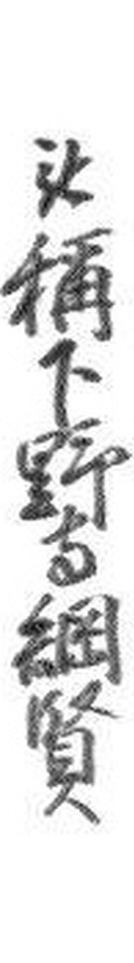被称下野守綱賢

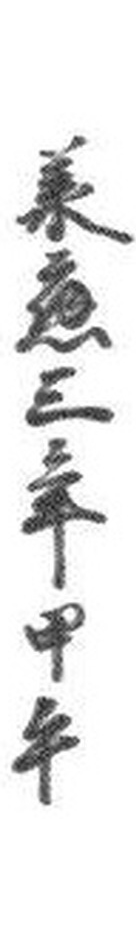承応三年申午
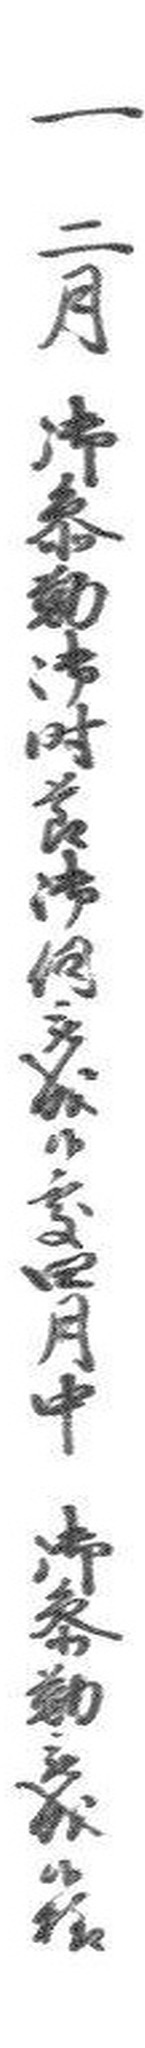一二月御参勤御時節御伺被成候処四月中御参勤被成候様
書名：家譜 五 光通公 従寛永十三年到万治二年
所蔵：福井県文書館 Fukui Prefectural Archives
